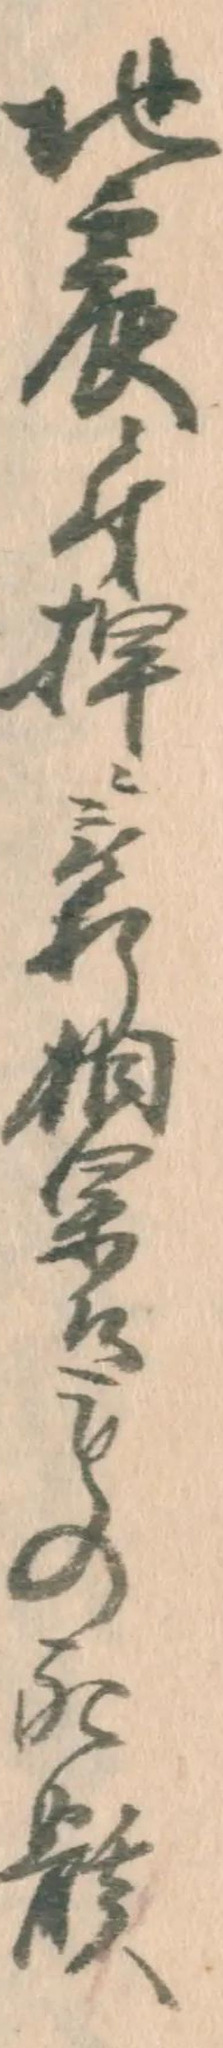│地震ニ付摧ニ被打相果候もの死骸
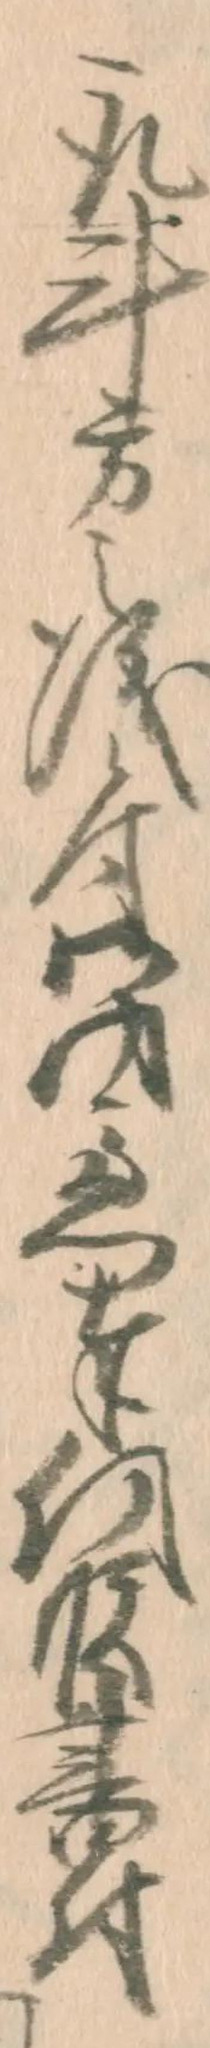│取計方之儀ニ付御内意奉伺候書付
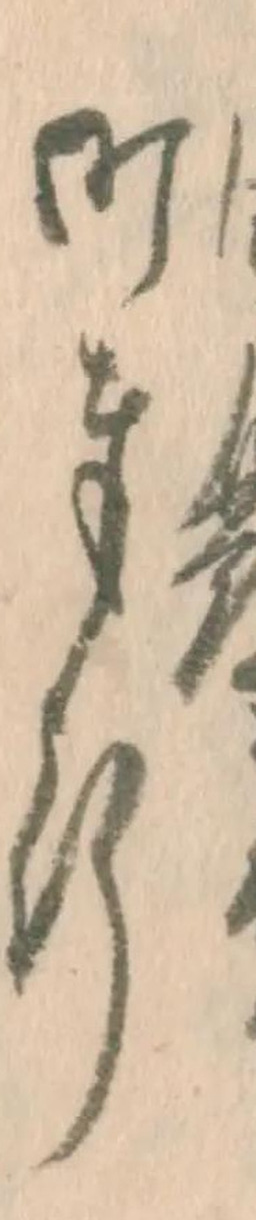│町奉行
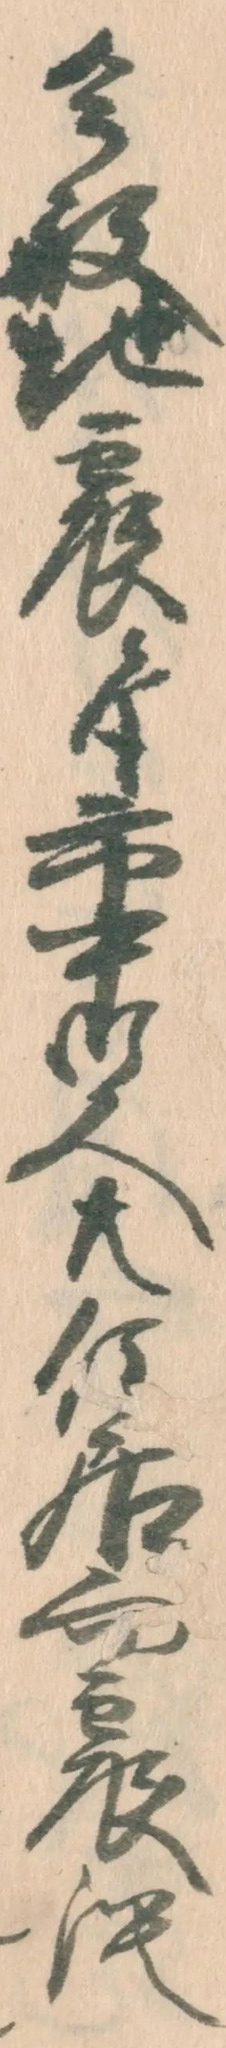今般地震ニ付市中町人共住居向震潰
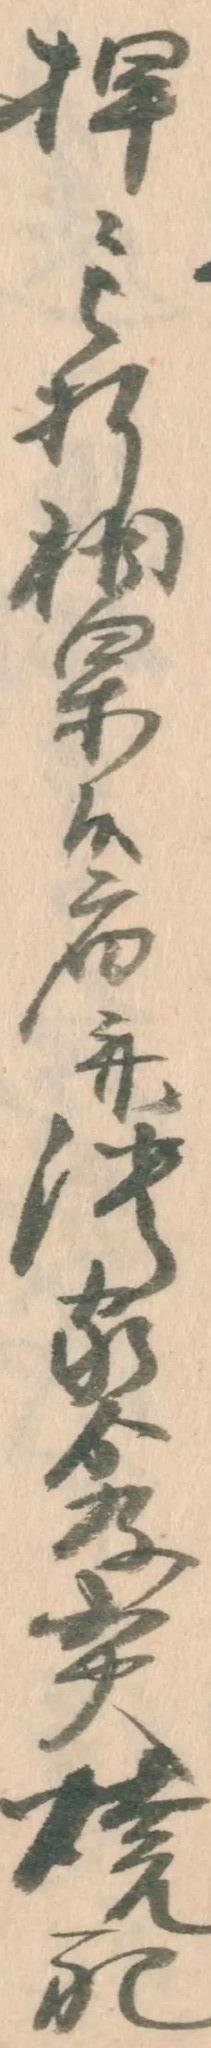摧ニ被打相果候者幷潰家ゟ及出火焼死
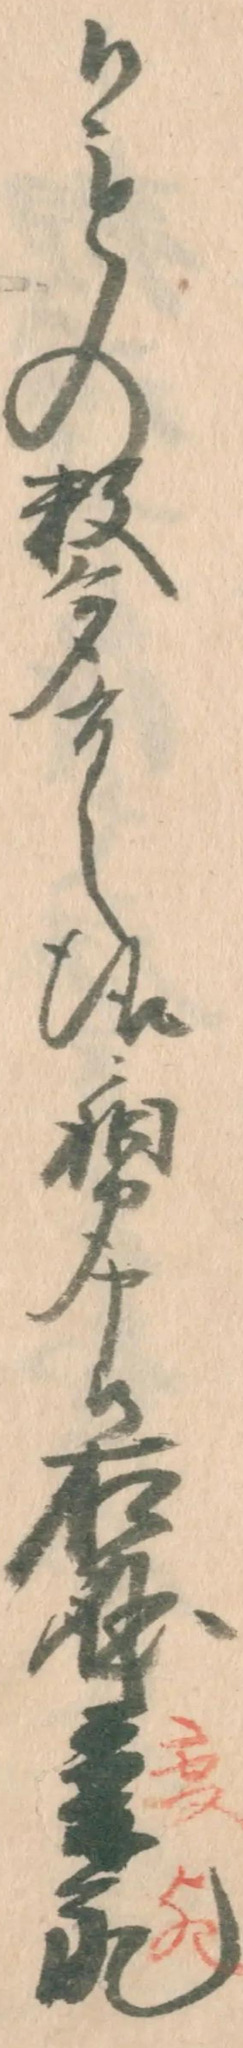候もの数多有之趣ニ相聞申候右体変死

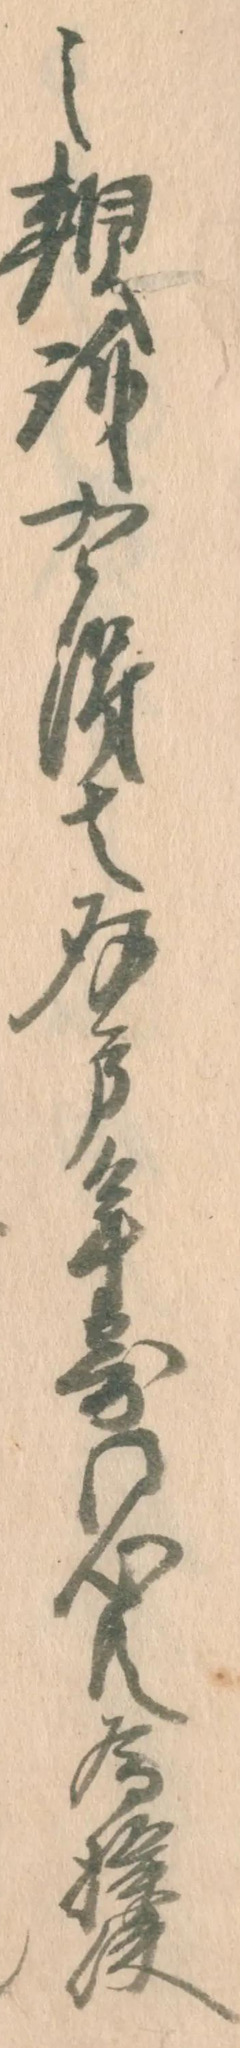之類訴有候得は双方年寄同心共為検使
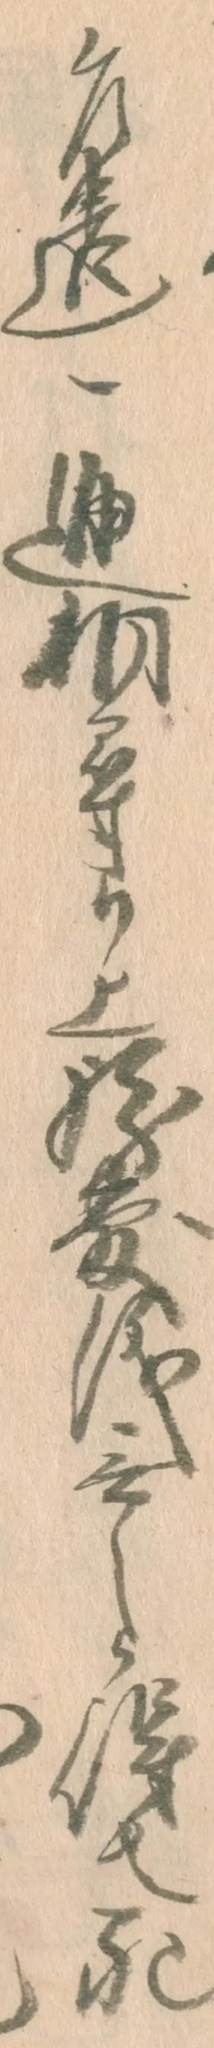差遣一通相尋候上紛敷儀無之候得は死
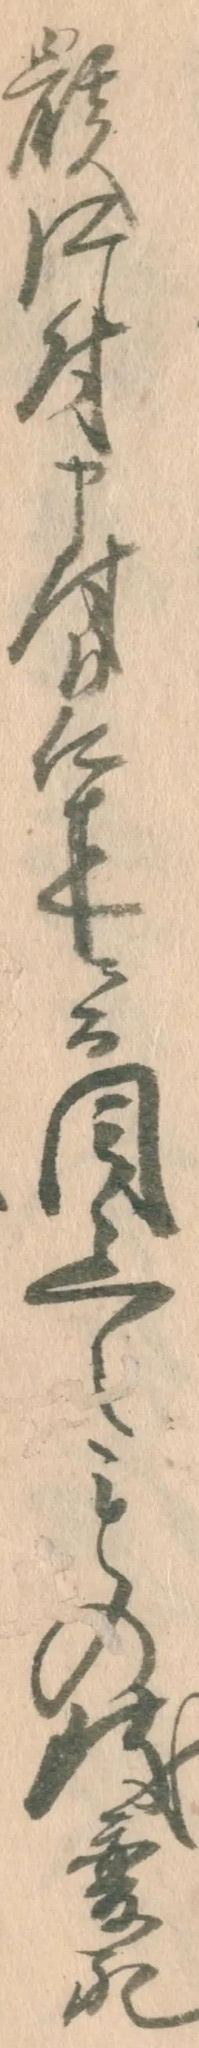骸片付申付候仕来ニて目上之もの致変死
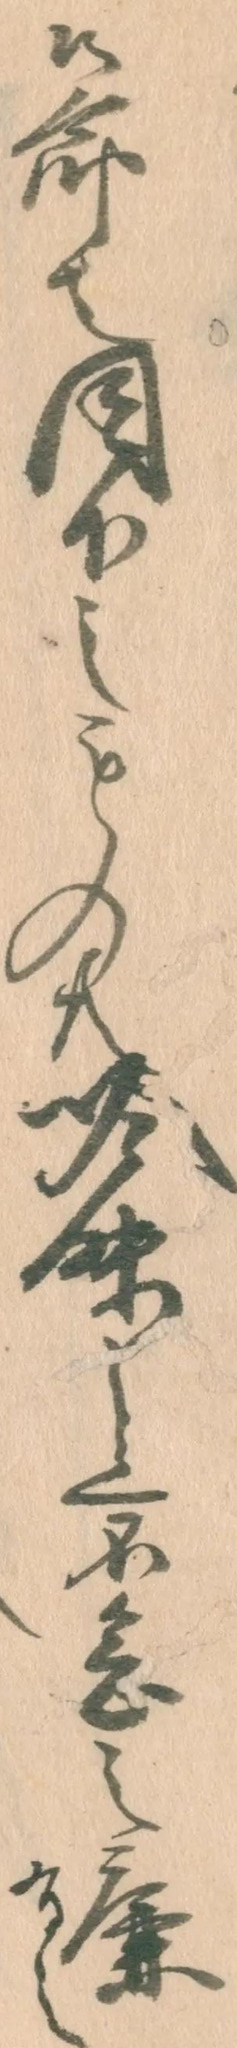候節は目下之もの共吟味之上不念之廉有之
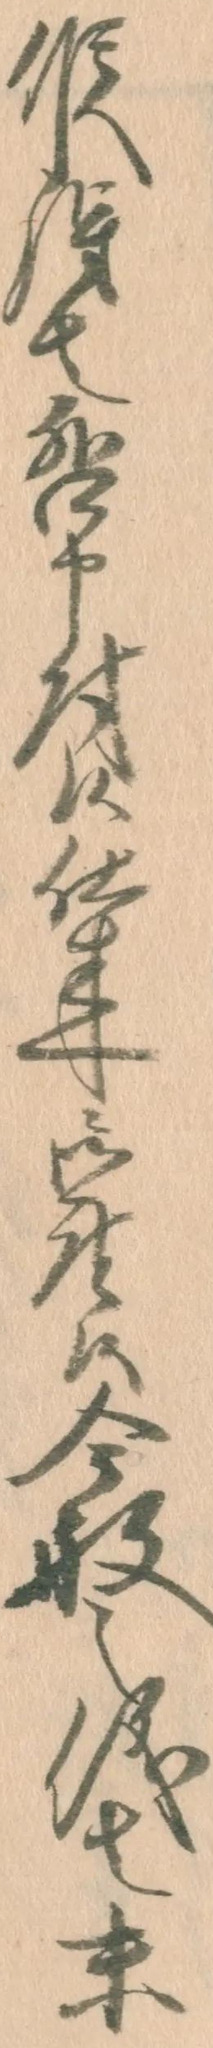候得は咎申付候仕来ニ御座候今般之儀は未
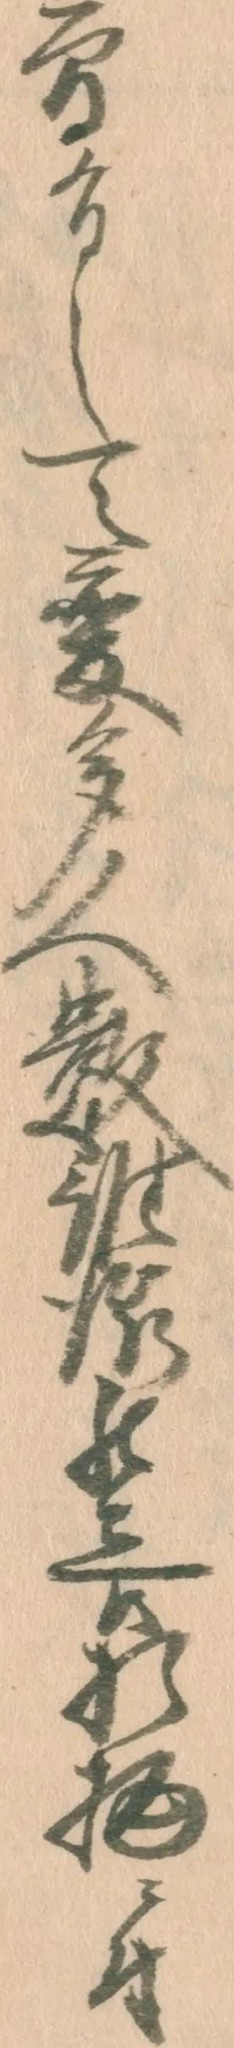曽有之天変多人数難渋罷有候折柄ニ付
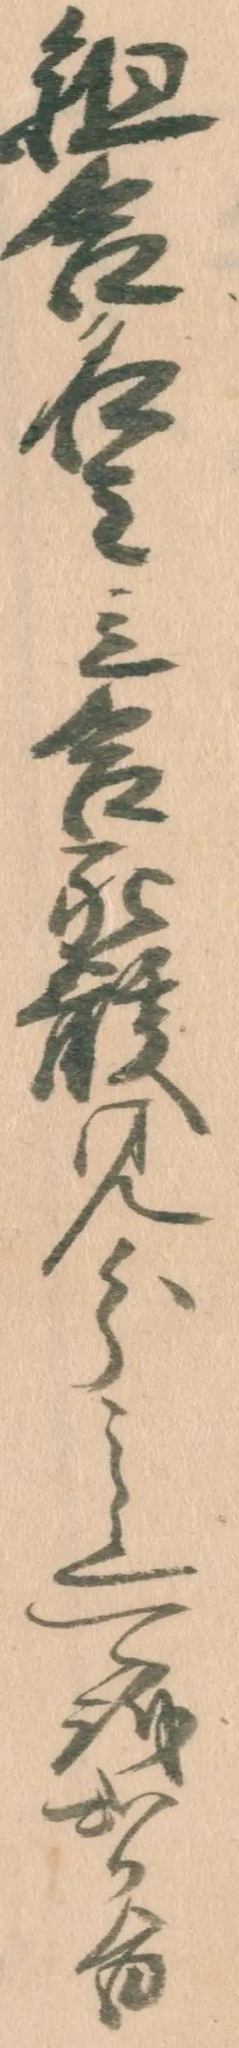組合名主立合死骸見分之上可訴出候旨
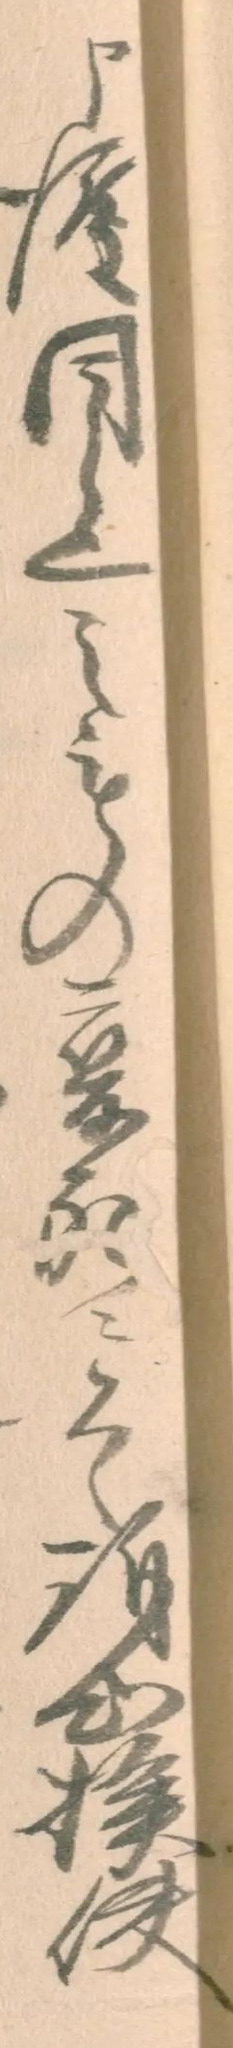申渡目上之もの変死ニて訴出検使
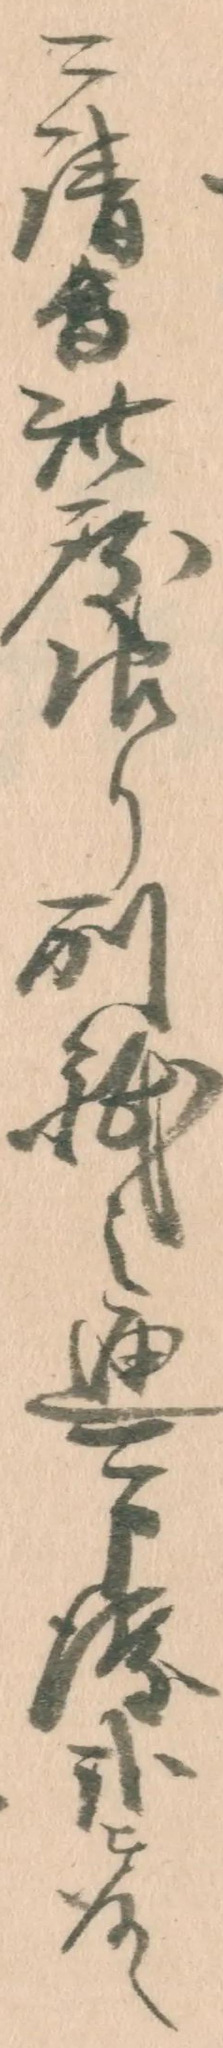可請旨此度限り別紙之通可申渡哉奉存候
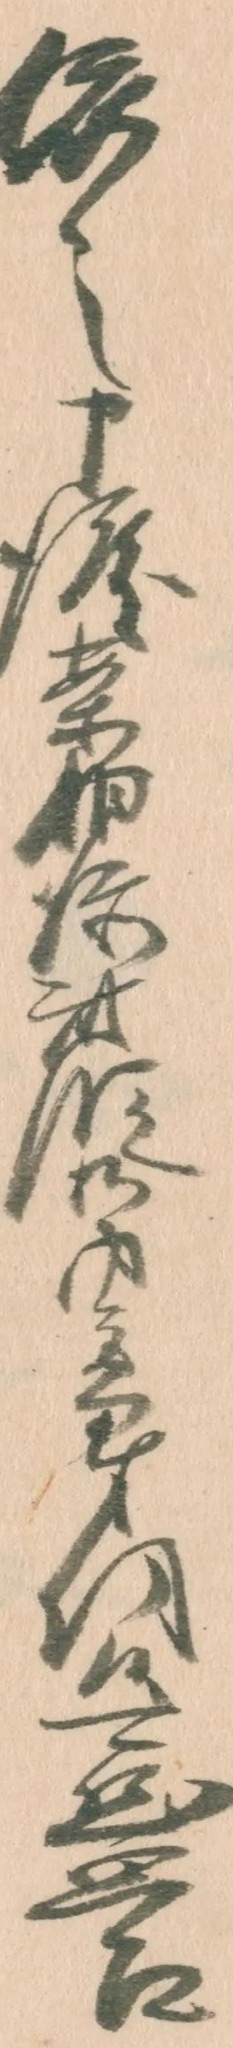依之申渡案相添此段御内意奉伺候可然思召
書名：地震災書留 2巻. [2] 内表紙に「地震一件　安政二卯年十月」とあり
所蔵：国立国会図書館 National Diet Library, JAPAN
